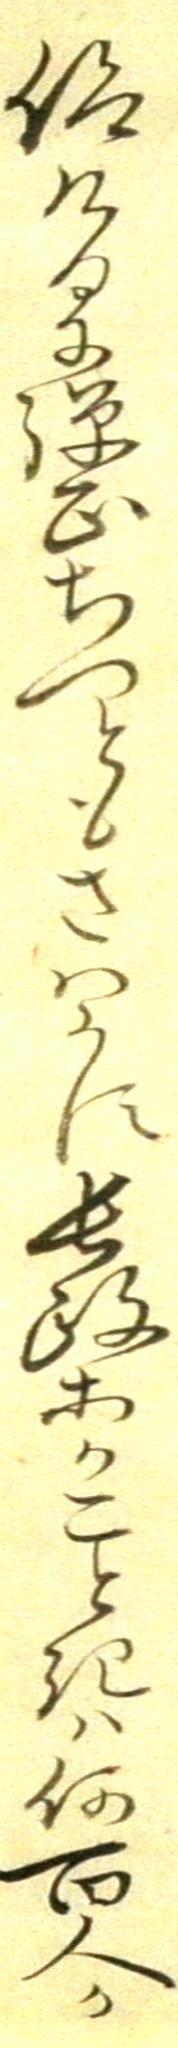仰けるに弾正ちつともさはかす長政等かこときは何百人か
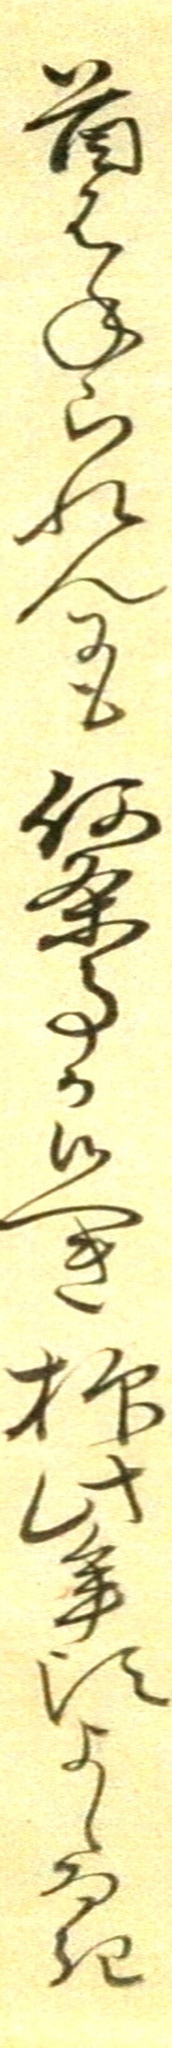首はねられんにも何条事か候へき抑此年頃よしなき
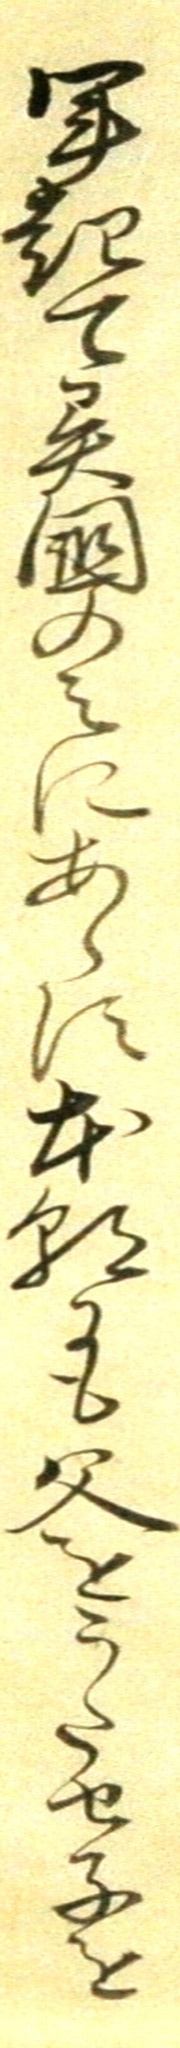軍起て異国のみにあらす本朝にも父をうたせし子を
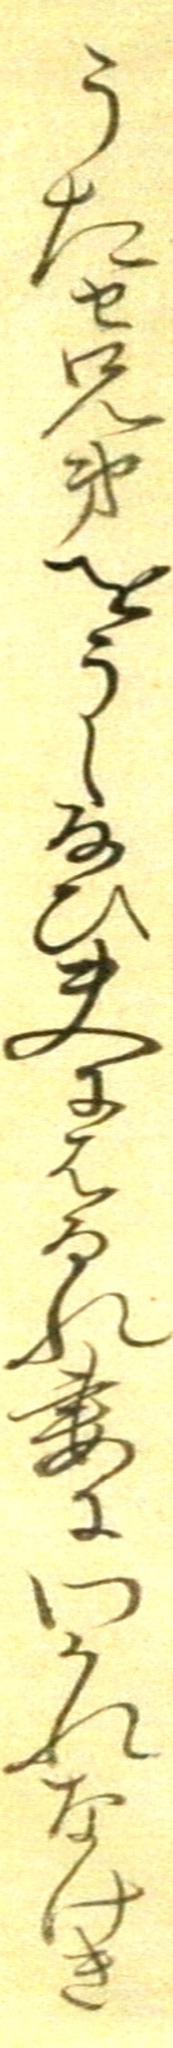うたせ兄弟をうしなひ夫にはなれ妻にわかれなけき
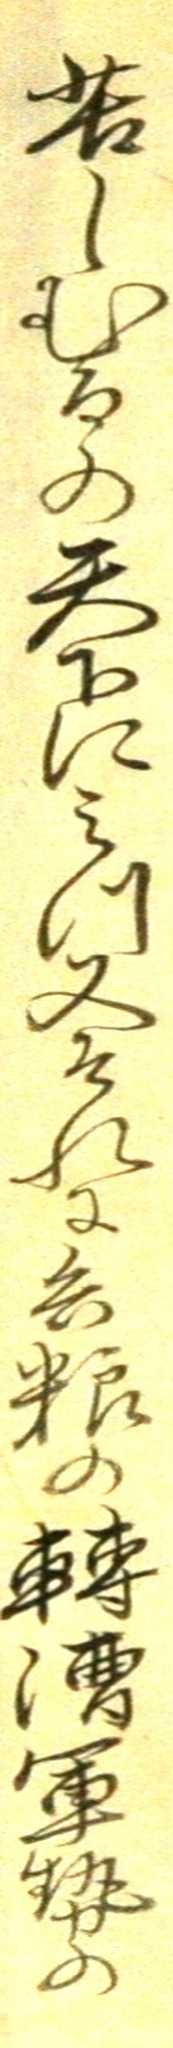苦しむるの天下にみつ又それに兵粮の転漕軍勢の

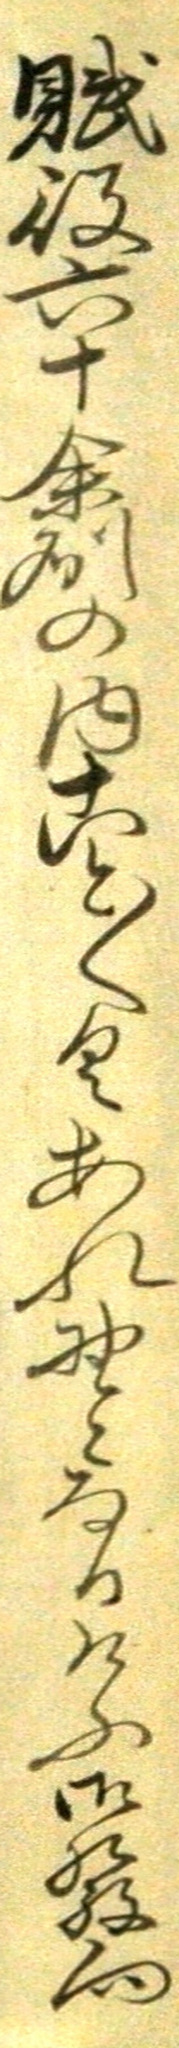賦役六十余州の内こと〳〵くあれ野となるけふ御発向
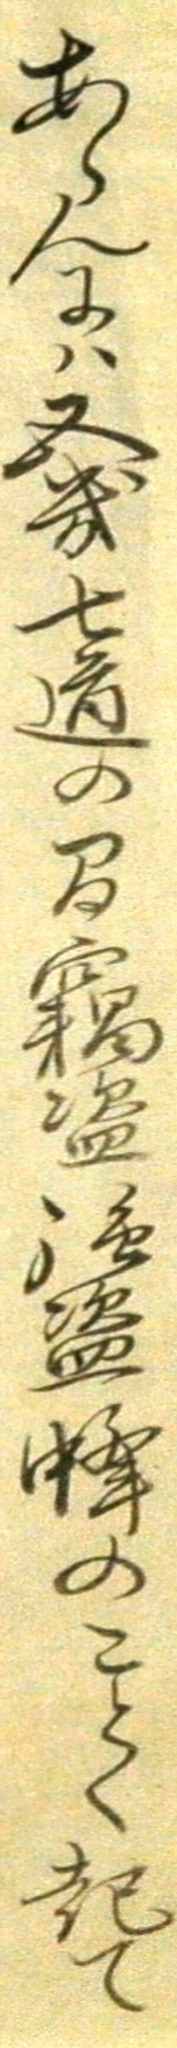あらんには五畿七道の間窃盗強盗蜂のことく起て
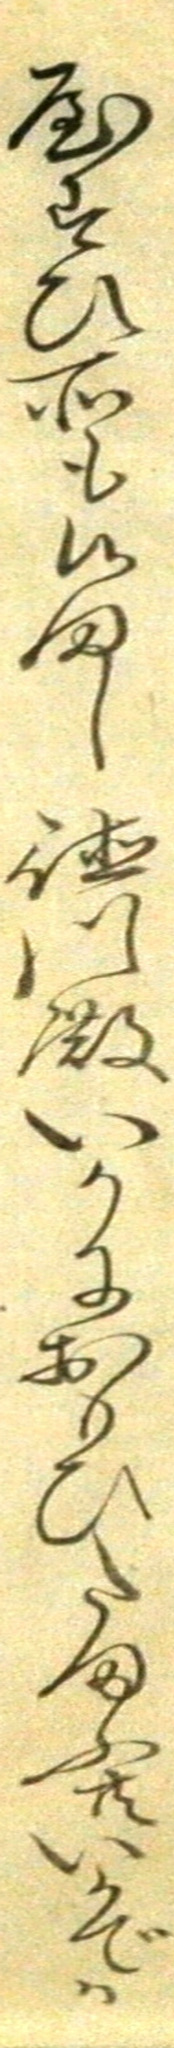やすひ所も候まし徳川殿いかにおもひたまふ共いかでか
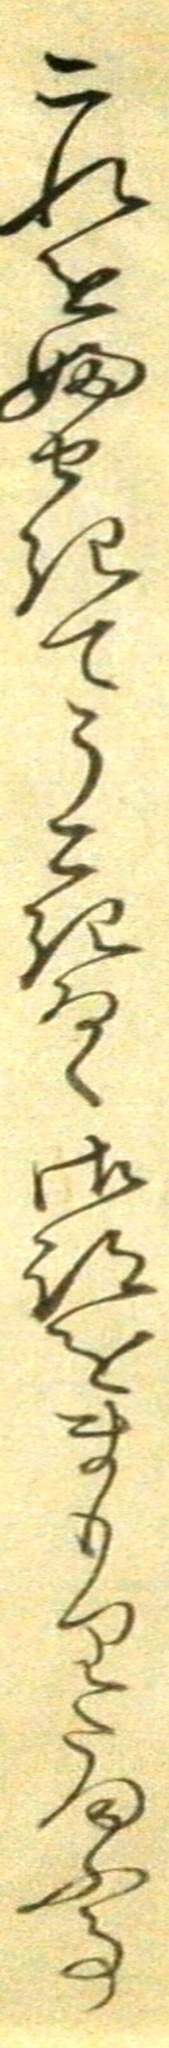これをふせきてうこきなく御跡をまもりたまふ事
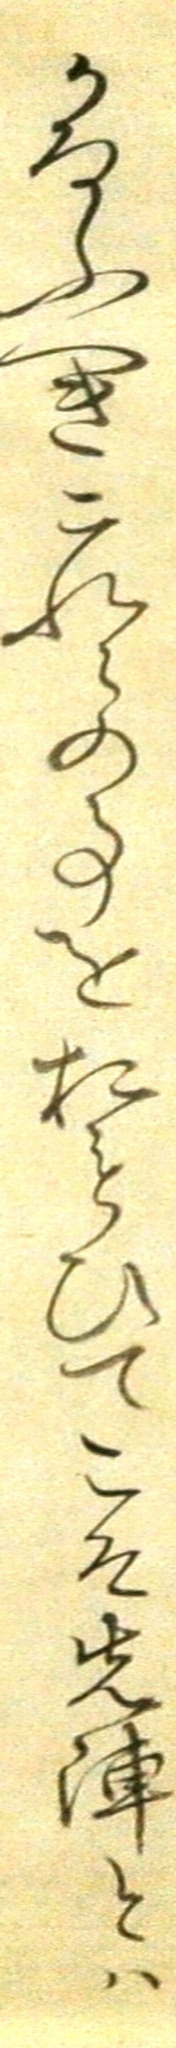かなふへきこれらの事をおもひてこそ先陣とは
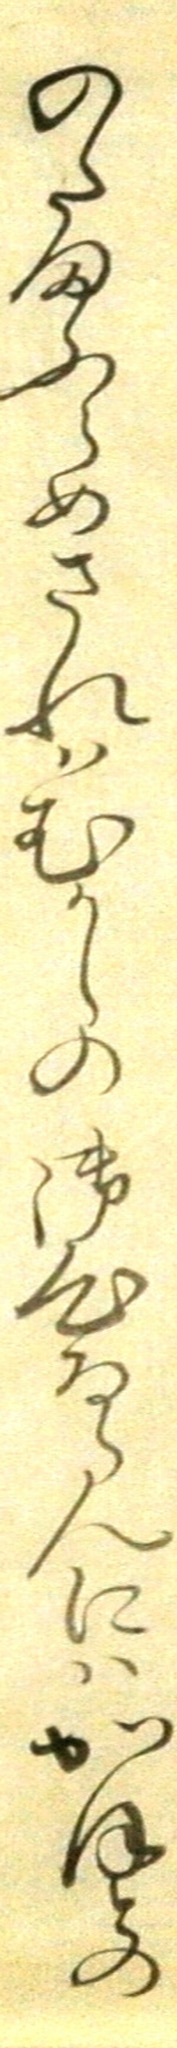のたまふらめされはむかしの御心ならんにはかほとの
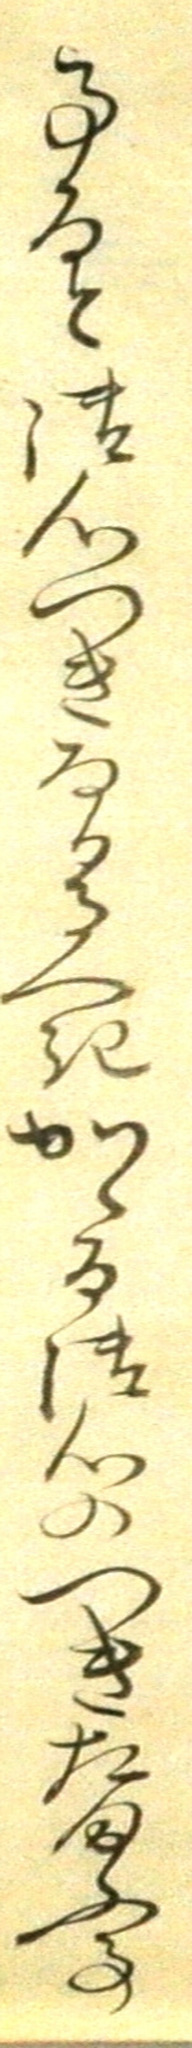事なと御心つきなかるへきかゝる御心のつきたまふ事
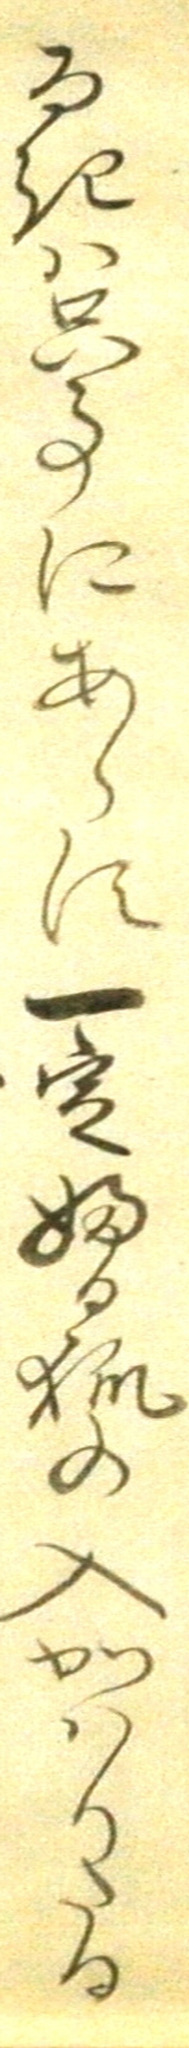なきは只事にあらす一定ふる狐の入かはりたる
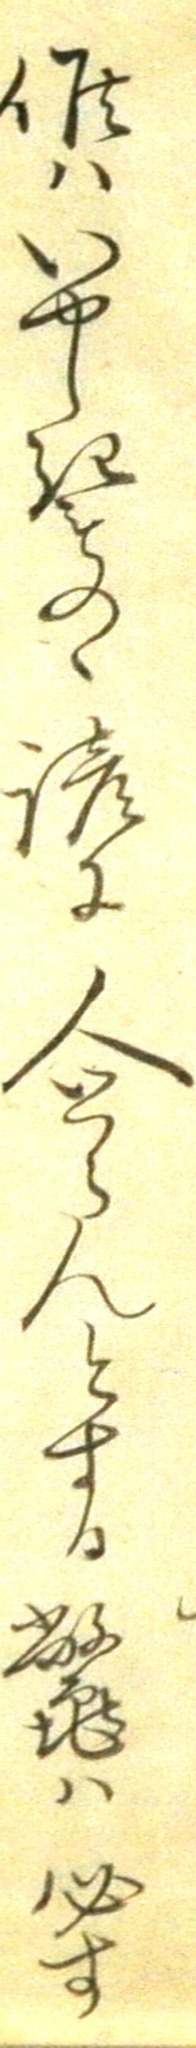候はいやしきものゝ諺に人とらんとする鼈は必す
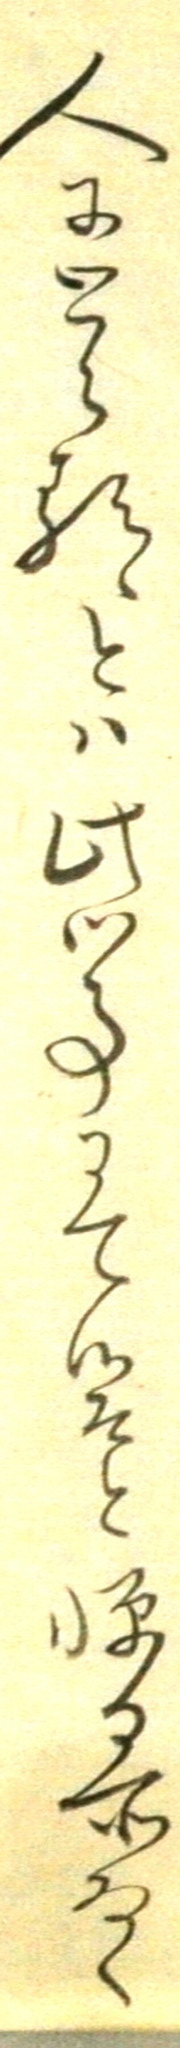人にとらるゝとは此ツ事にて候そと憚る所なく
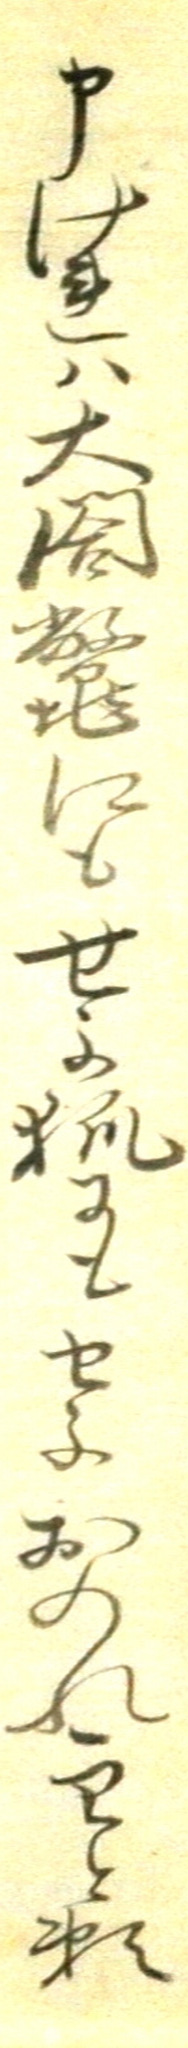申けれは太閤鼈にもせよ狐にもせよおのれ主と頼
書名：藩翰譜（七・上）
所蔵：伊那市立高遠町図書館・合同会社AMANE
